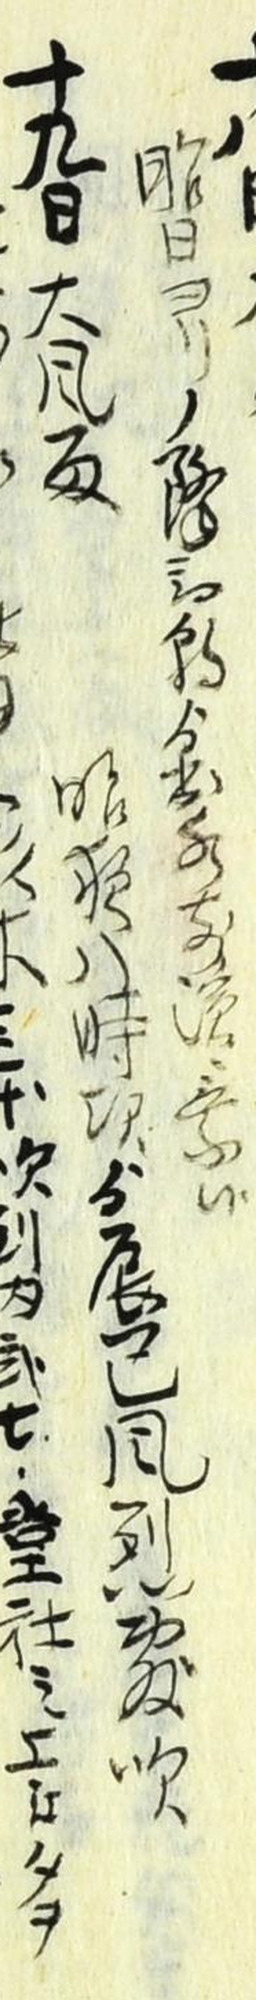十九日大風雨昨夜八時頃ゟ辰巳風烈敷吹
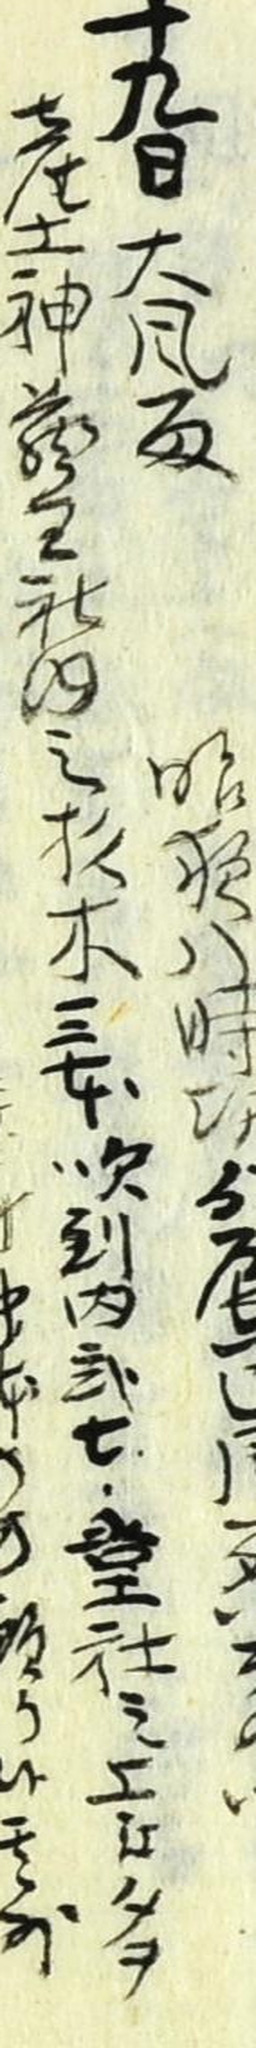産土神蔵王社内之杉木三本吹到内弐本堂社之上江タヲ
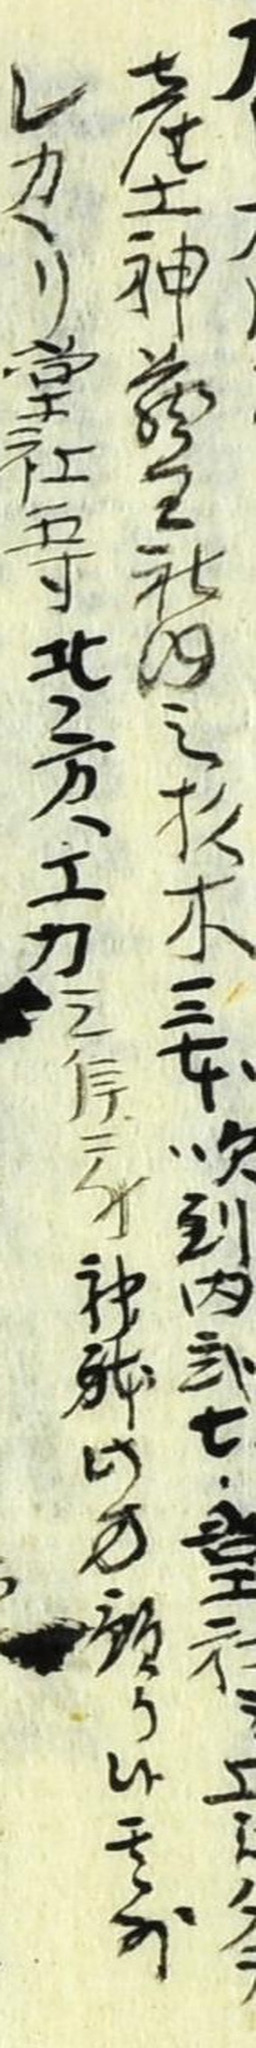レカヽリ堂社五寸北之方へエカミ候ニ付神体此方預リ候其外
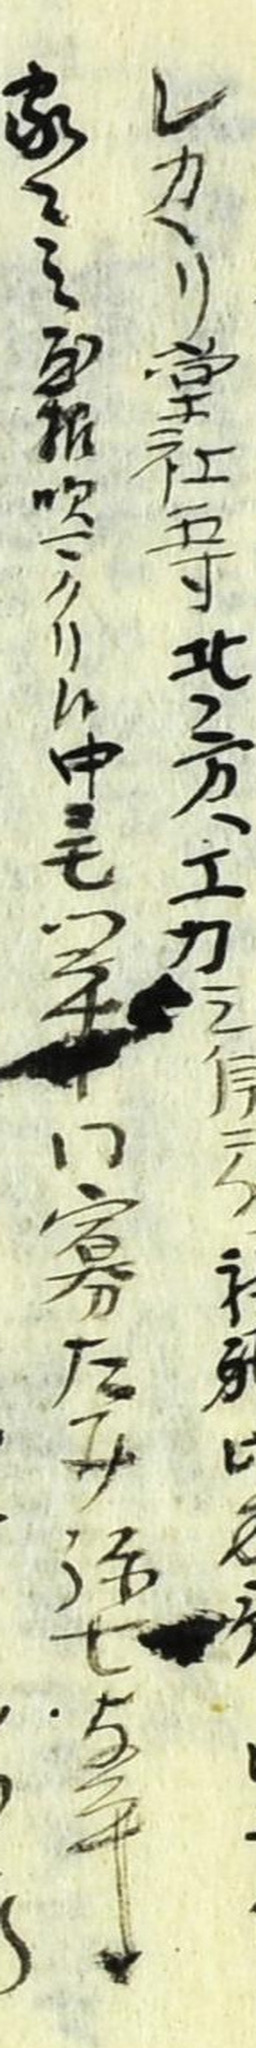家々之屋根吹マクリ候中ニモ門平同寡たみ弥七与平
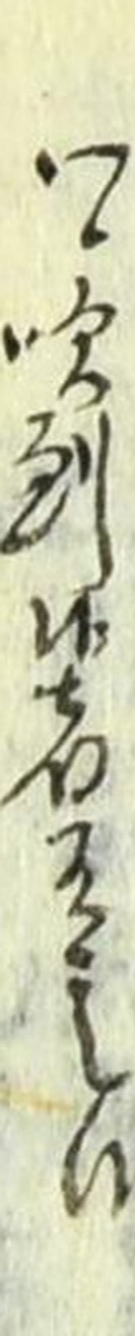ツヽ吹到候者有之候
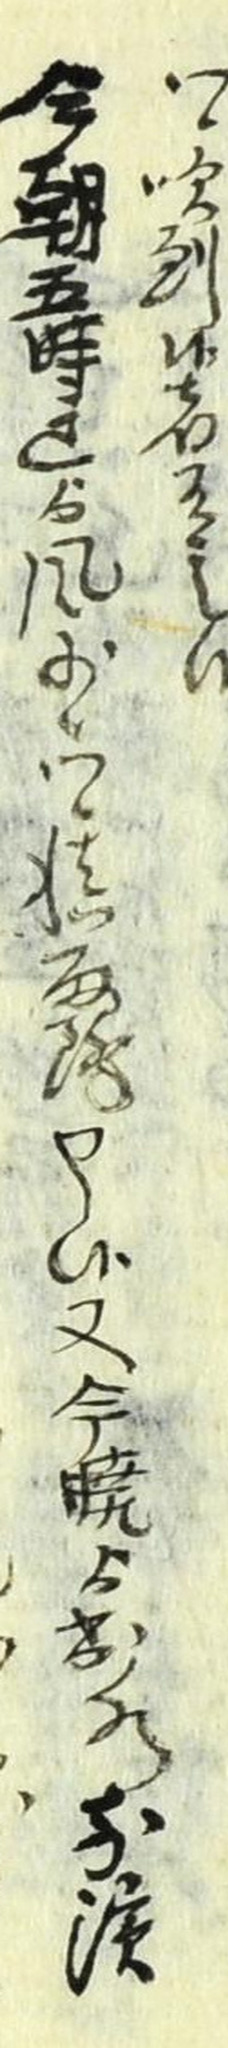今朝五字過ゟ風少々ツヽ慎雨降申候又今暁ゟ出水前浜
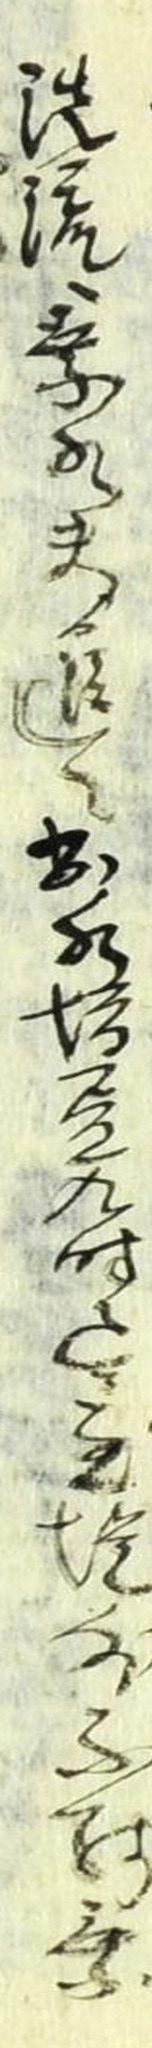洗流へ乗水夫ゟ追々出水増昼九時過に至堤外不残乗
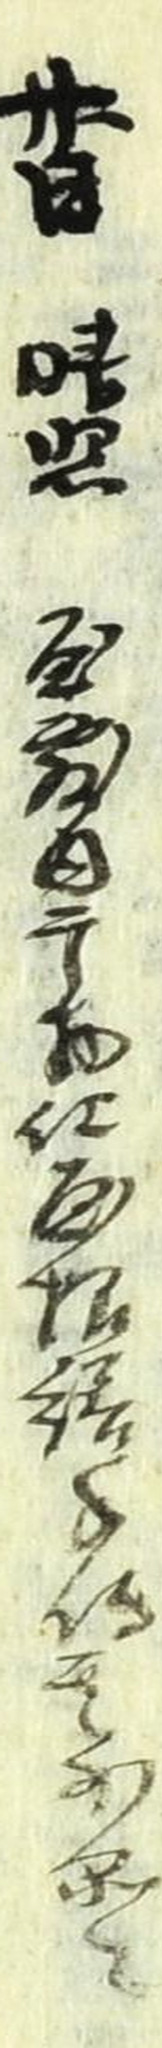廿日晴照屋敷内干物仕屋根繕手伝其外品々
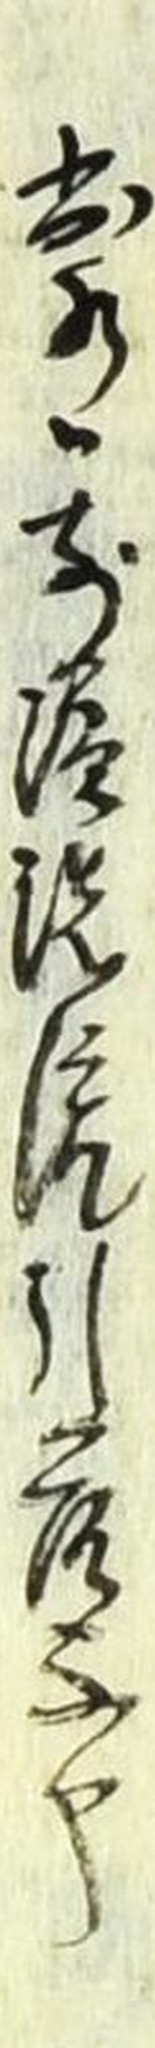出水ハ前浜洗流引落不申
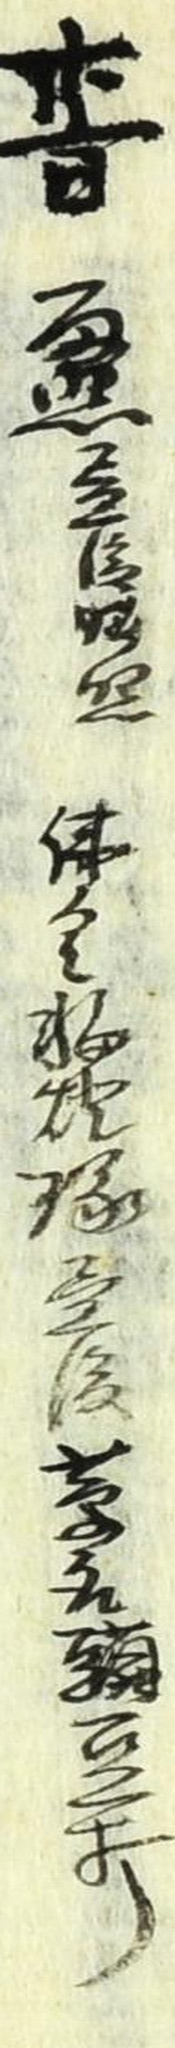廿一日雨照昼後晴照仏具輪灯琢昼後草取豌豆打
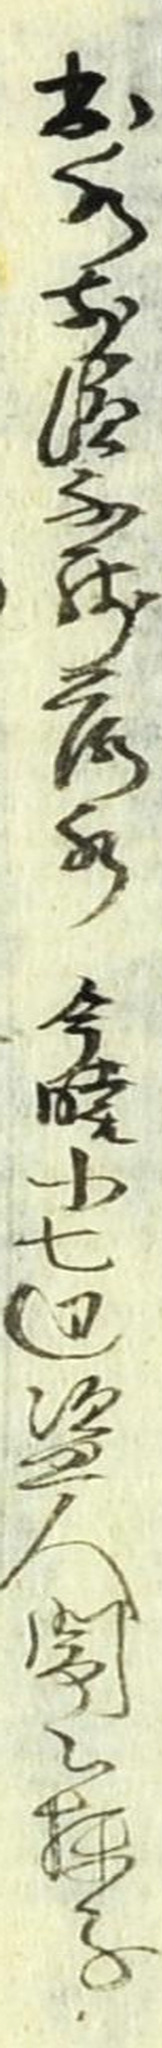出水前浜不残落水今暁小七辺盗人閙候様子
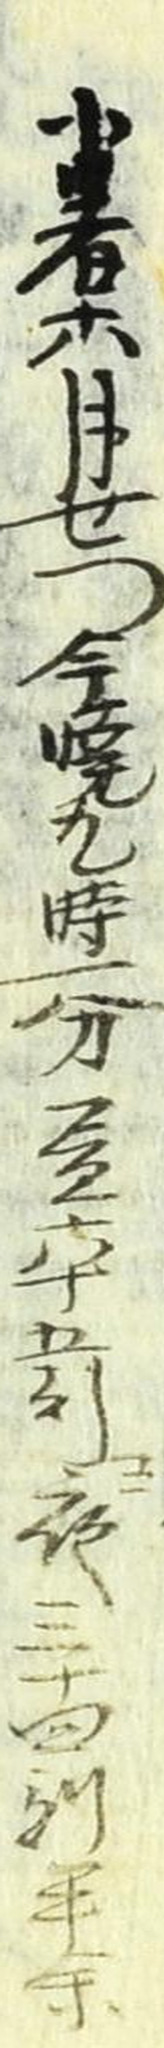小暑六月せつ今暁九時一分昼六十五刻ヨ夜三十四刻半余
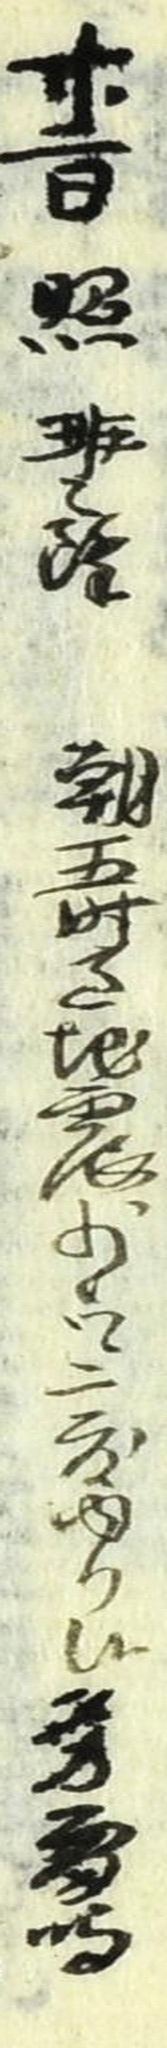廿二日照班々古降朝五時過地震少々ツヽ二度ゆり候夕方雷鳴
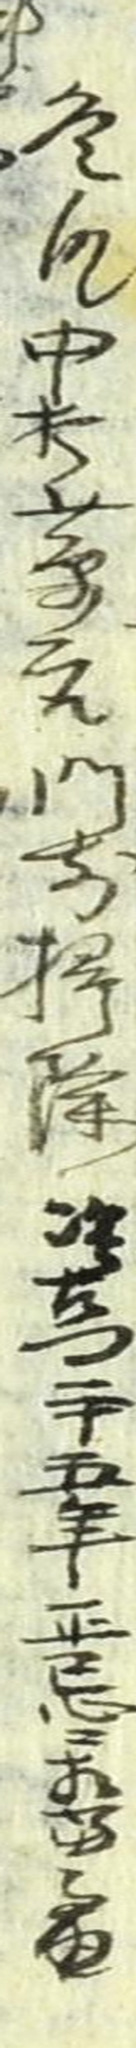冬瓜中打草取門前掃除次郎左衛門二十五年正忌に相当る由
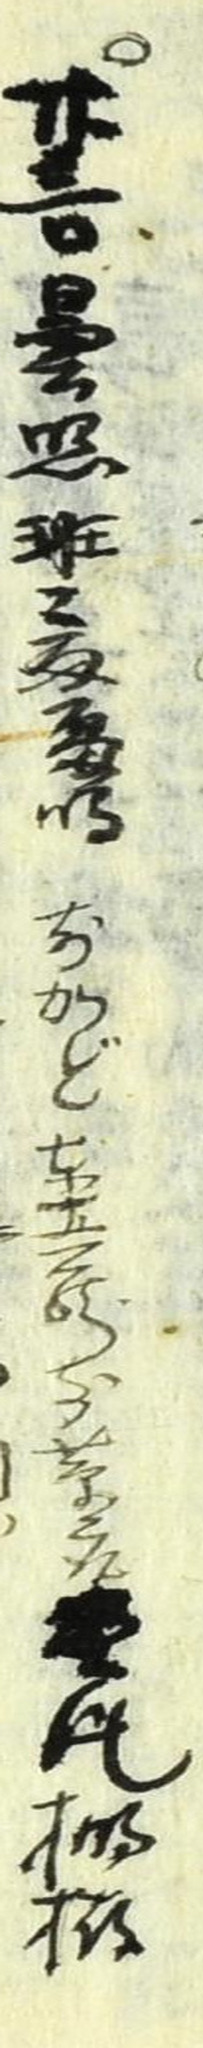○廿三日曇照班々雨雷鳴前かど東土蔵前草取瓜棚拵
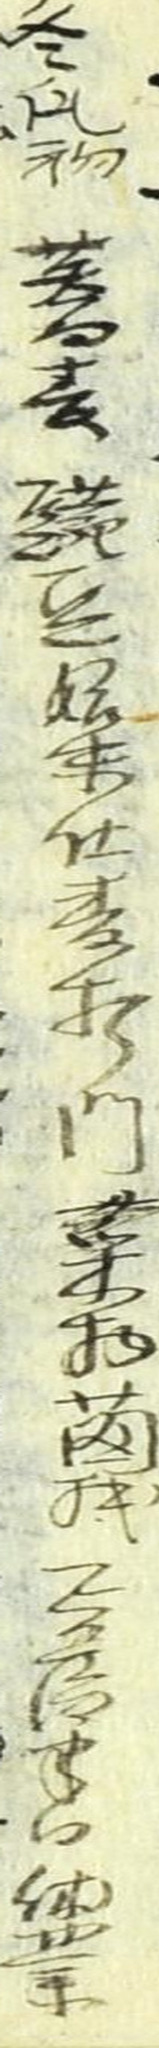蕎麦豌豆始末仕麦打門菜物薗残昼後半日休業
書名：（日記）
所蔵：福井県文書館 Fukui Prefectural Archives
